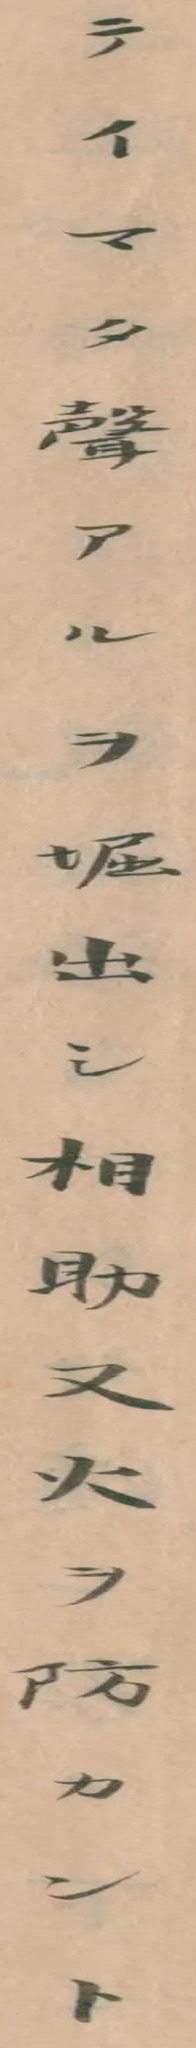テイマタ声アルヲ掘出シ相助又火ヲ防カント
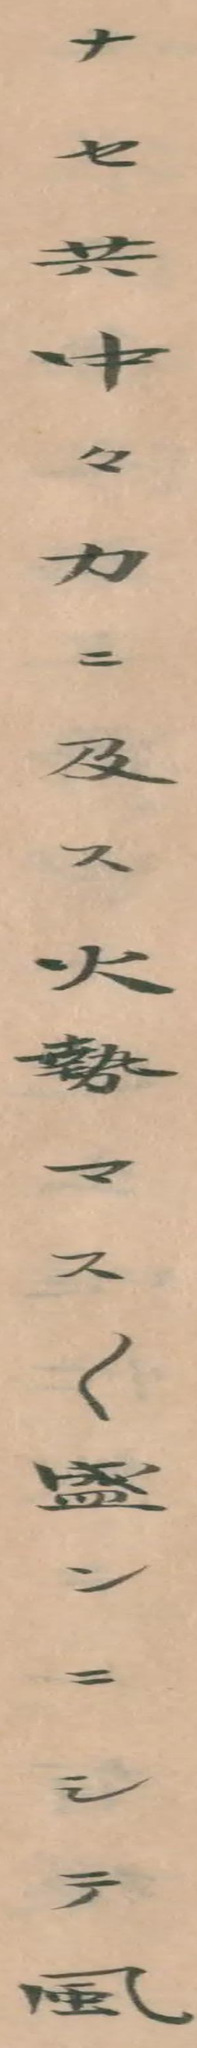ナセ共中々力ニ及ス火勢マス〳〵盛ンニシテ風
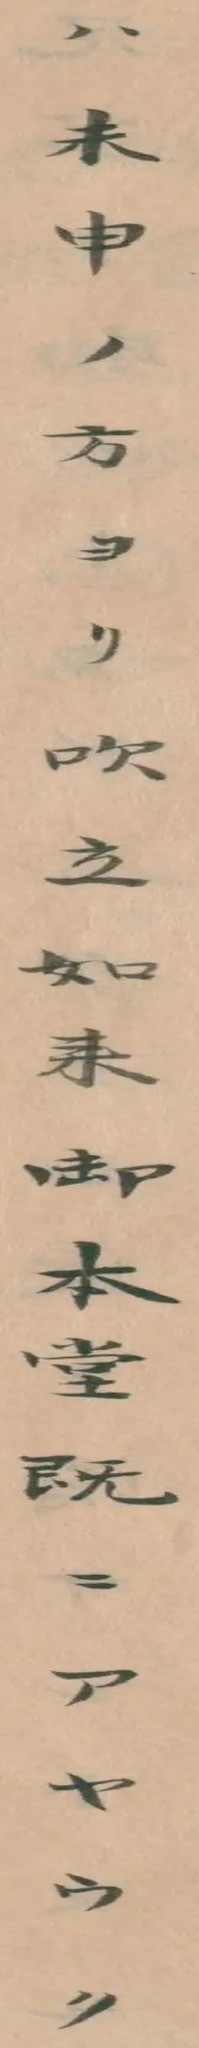ハ未申ノ方ヨリ吹立如来御本堂既ニアヤウク
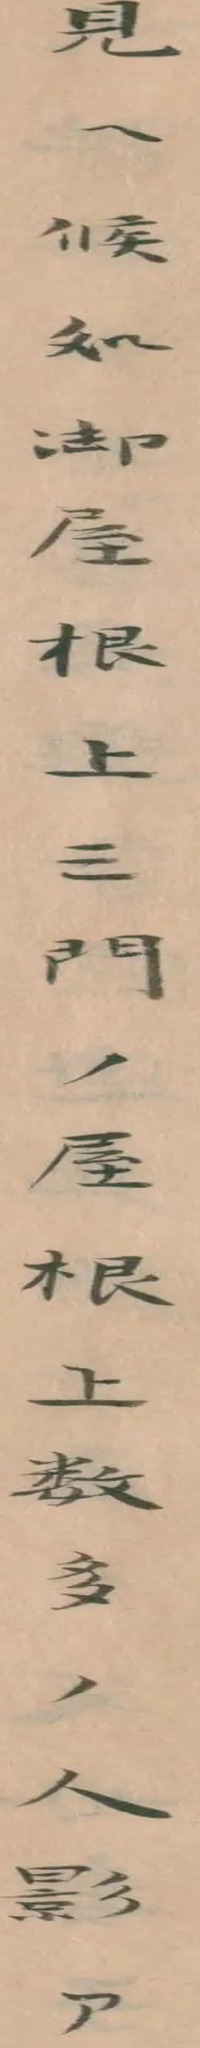見ヘ候処御屋根上三門ノ屋根上数多ノ人影ア
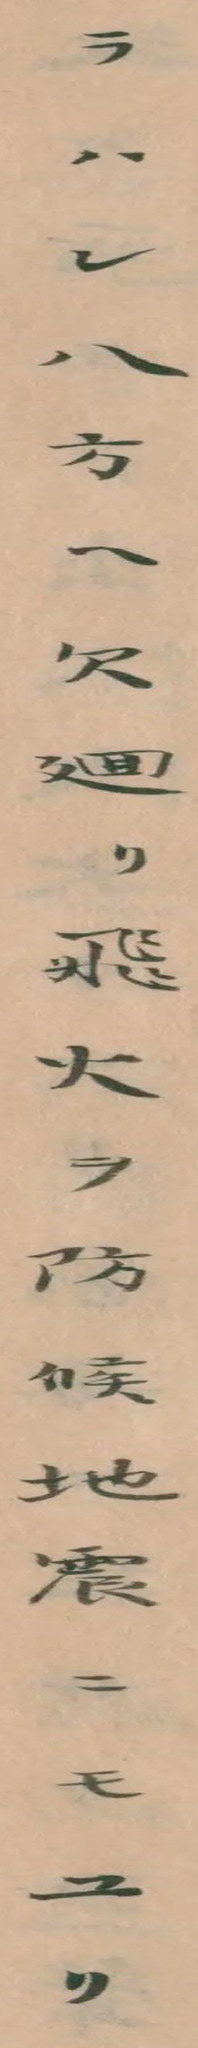ラハレ八方ヘ欠廻リ飛火ヲ防候地震ニモユリ
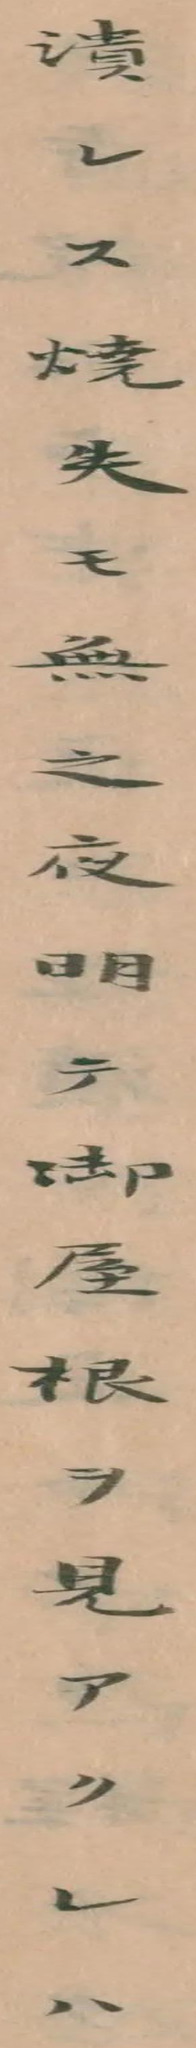潰レス焼失モ無之夜明テ御屋根ヲ見アクレハ
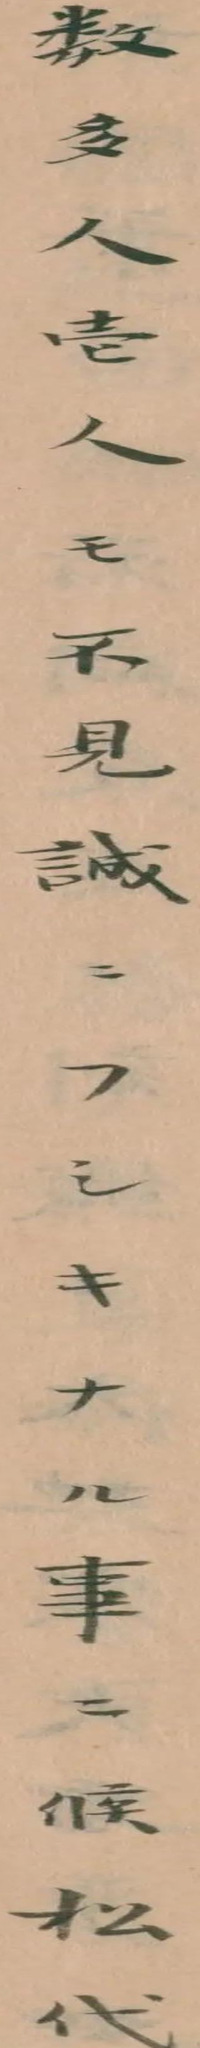数多人壱人モ不見誠ニフシキナル事ニ候松代
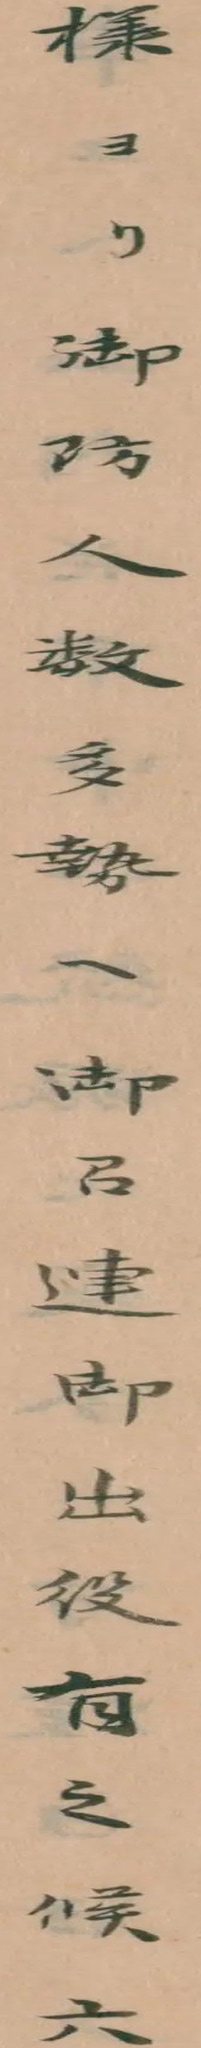様ヨリ御防人数多勢ヘ御召連御出役有之候六
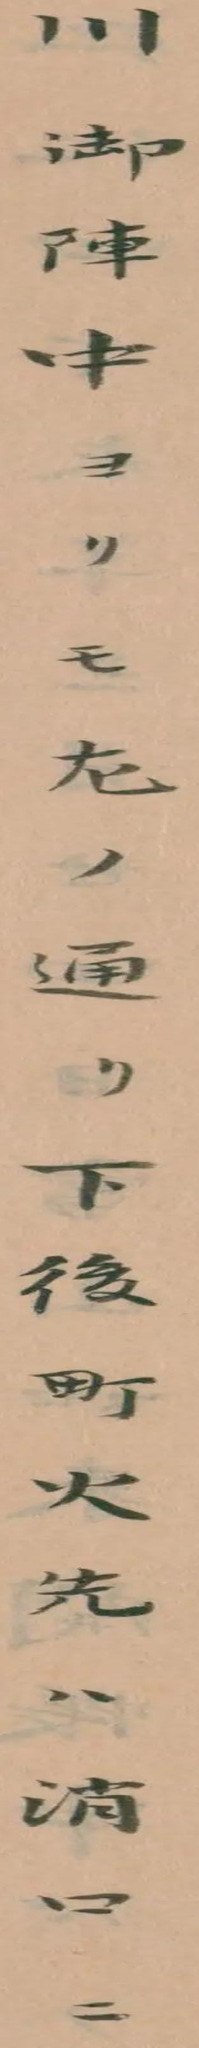川御陣中ヨリモ左ノ通リ下後町火元ハ消口ニ
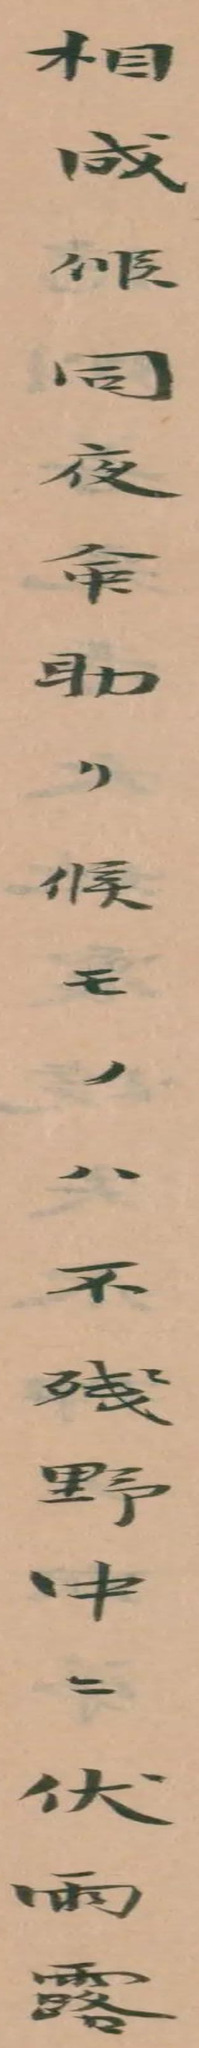相成候同夜命助リ候モノハ不残野中ニ伏雨露
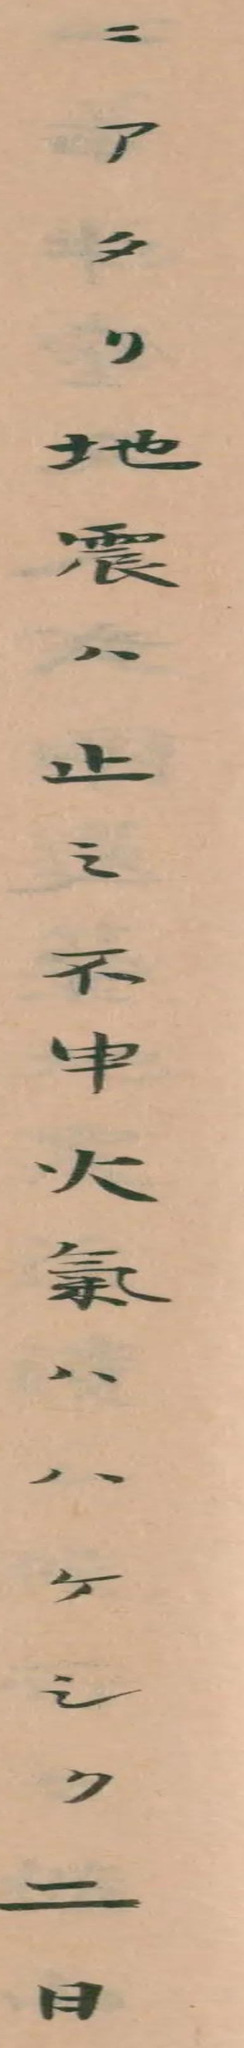ニアタリ地震ハ止ミ不申火気ハハケシク二日
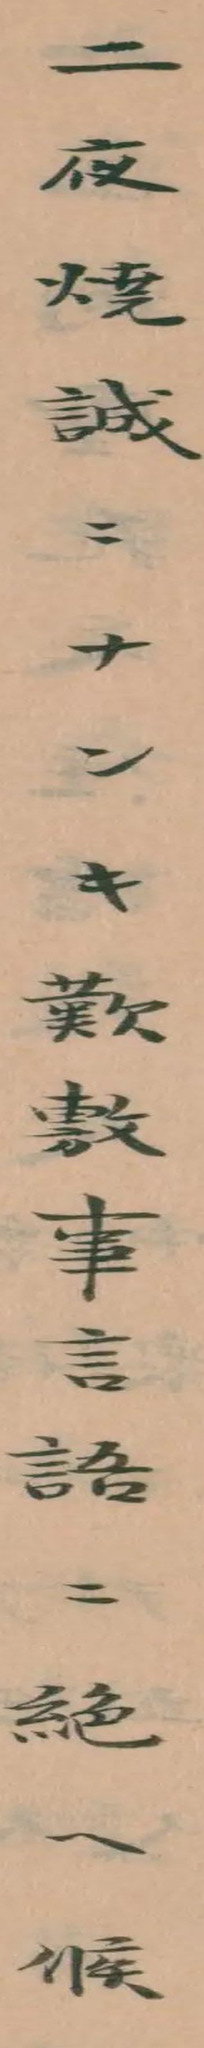二夜焼誠ニナンキ歎敷事言語ニ絶ヘ候
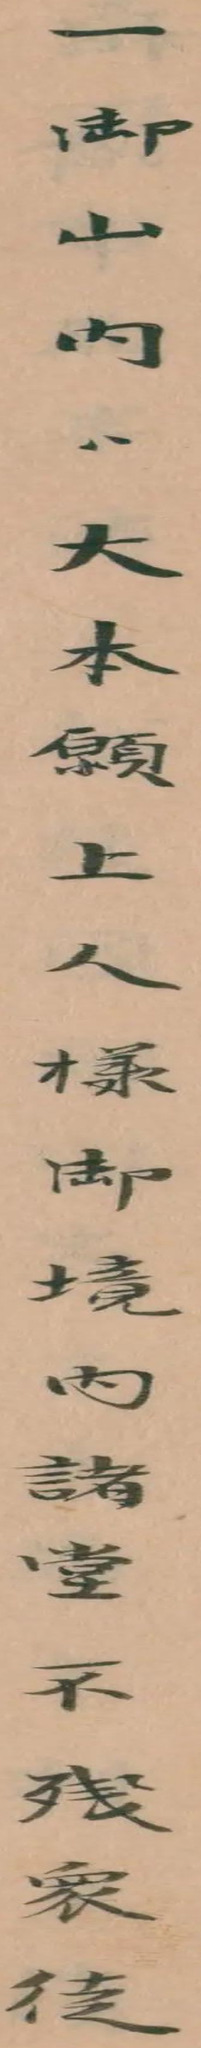一御山内ハ大本願上人様御境内諸堂不残衆徒
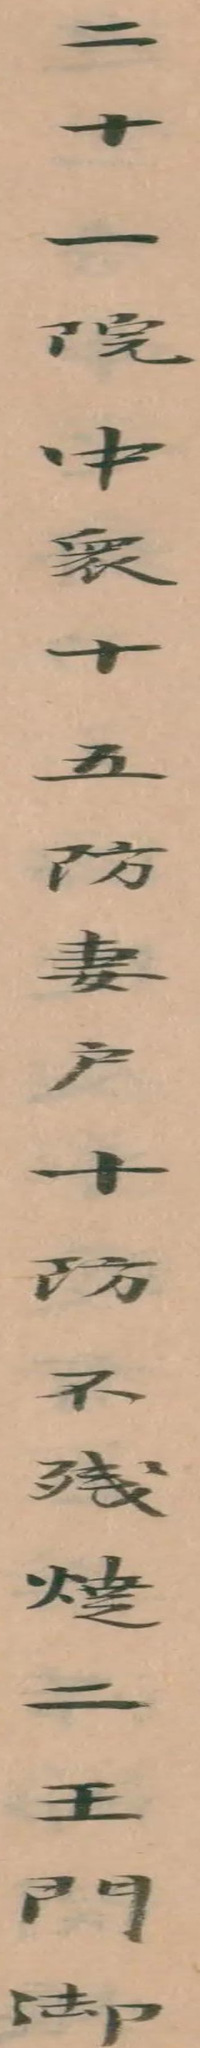二十一院中衆十五防妻戸十防不残焼ニ王門御
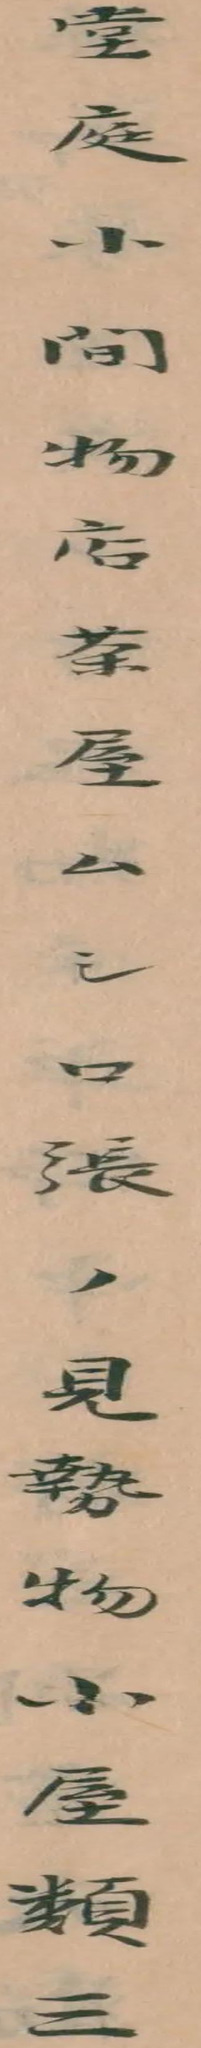堂庭小間物店茶屋ムシロ張ノ見勢物小屋類三
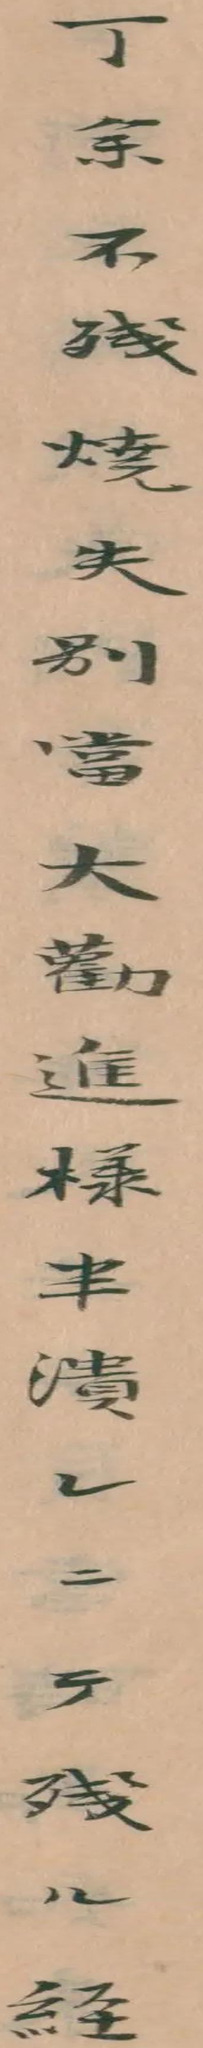丁世余不残焼失別当大勧進様半潰レニテ残ル経
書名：地災撮要. 巻5-6(地震之部)
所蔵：国立国会図書館 National Diet Library, JAPAN
